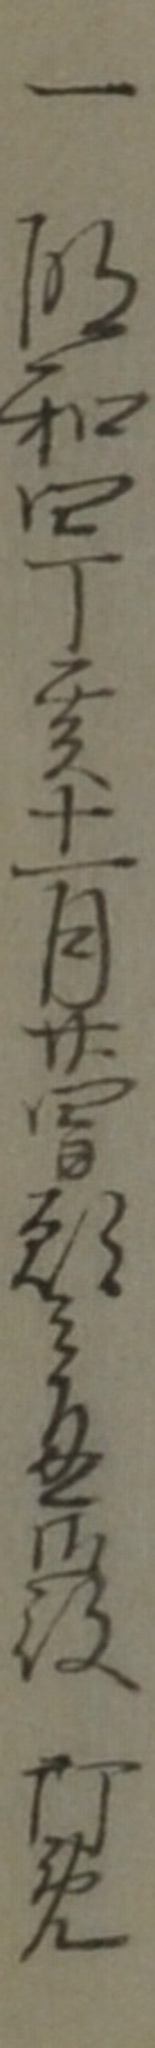一明和四丁亥十一月廿四日願之通御役御免
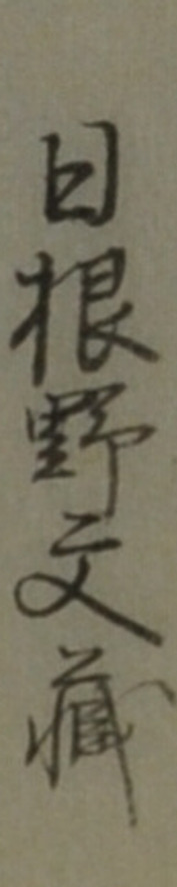日根野文蔵
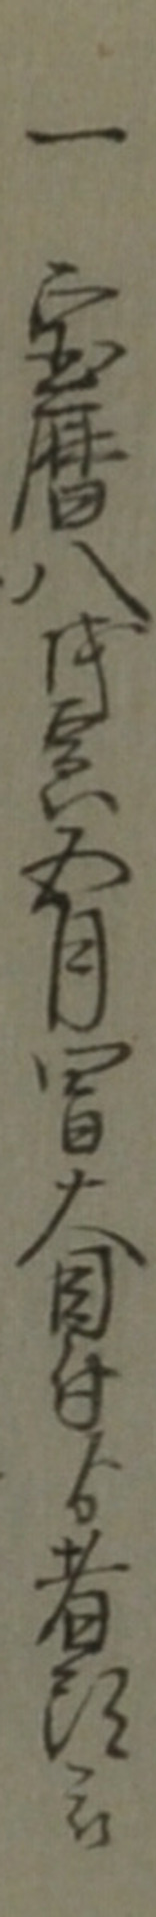一宝暦八戊寅五月四日大目付ゟ者頭被
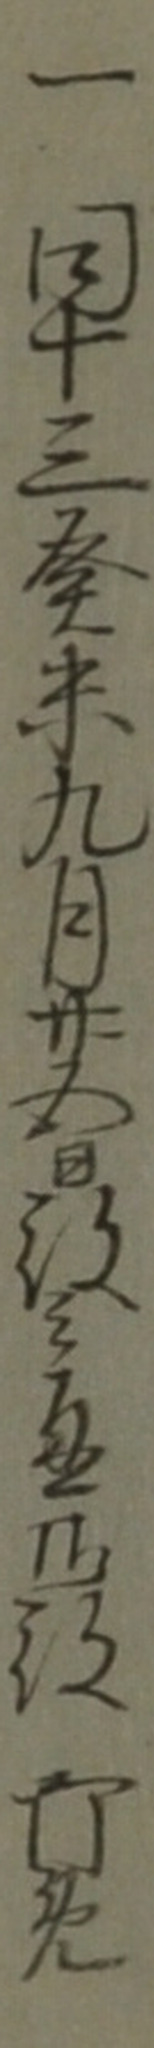一同十三癸未九月廿五日役之通御役御免
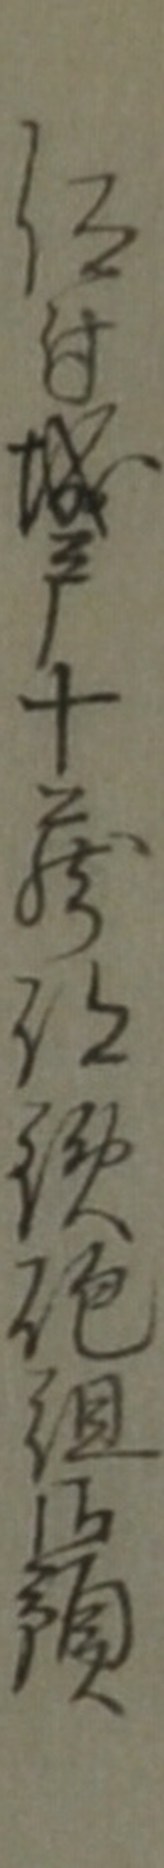仰付城戸十蔵跡鉄砲組御預
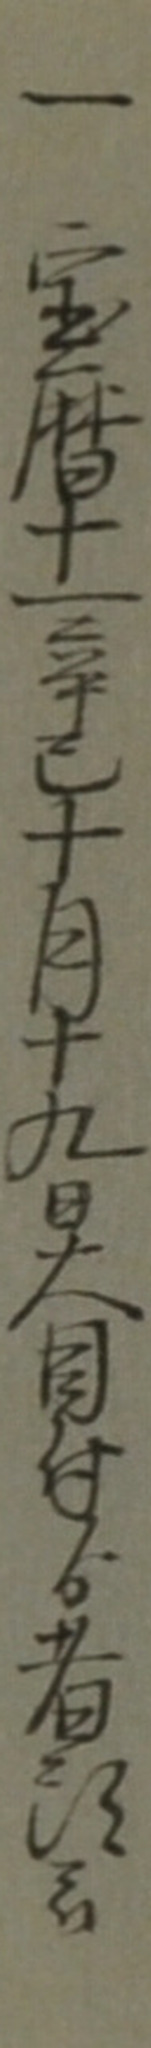一宝暦十一辛巳十月十九日大目付ゟ者頭被
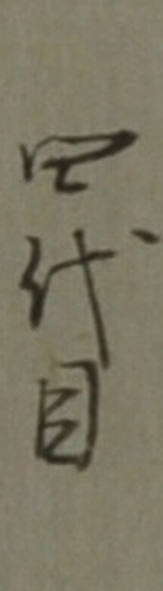四代目
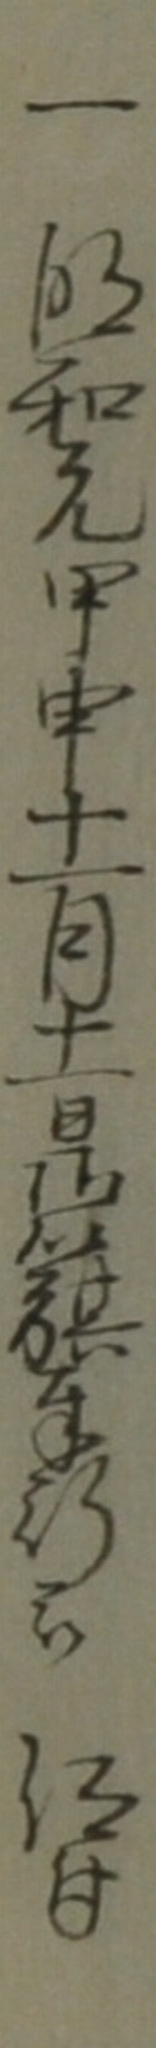一明和元甲申十一月十一日御籏奉行仰付
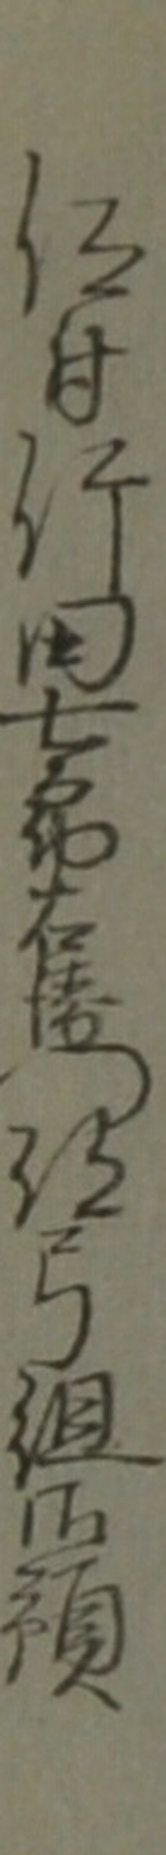仰付竹田七郎右衛門跡弓組御預

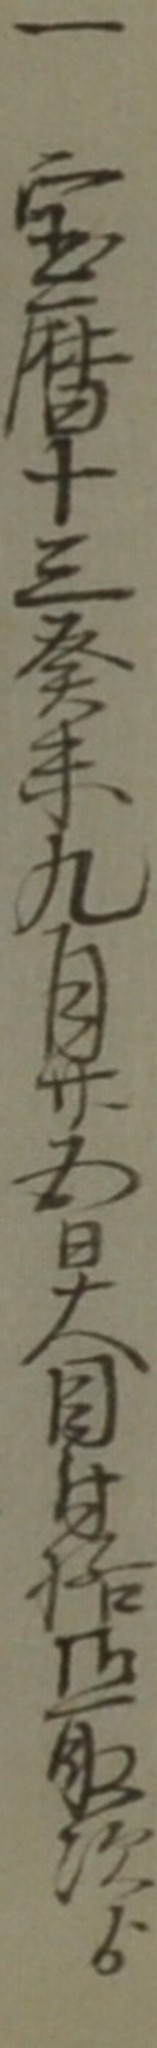一宝暦十三癸未九月廿五日大目付格御取次ゟ
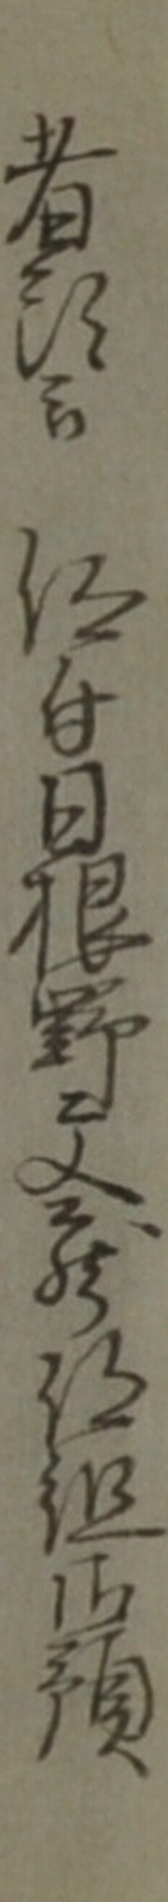者頭被仰付日根野文蔵跡組御預
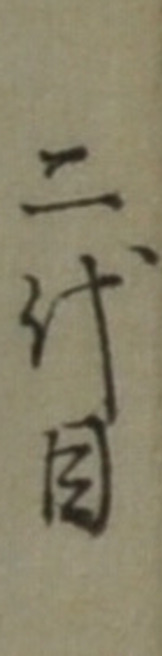二代目
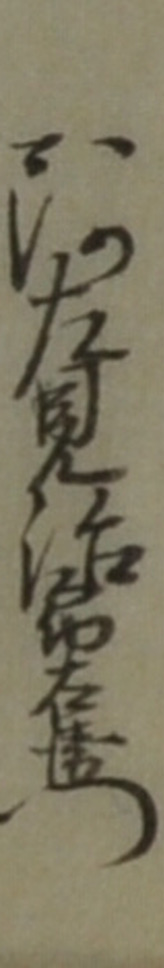阿左見治郎右衛門
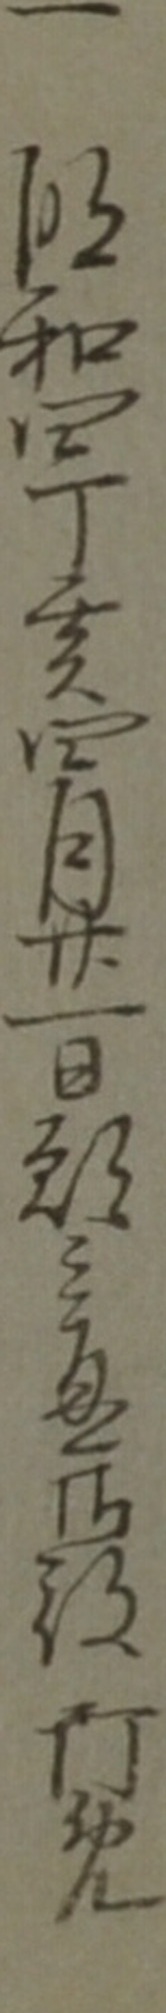一明和四丁亥四月廿一日願之通御役御免
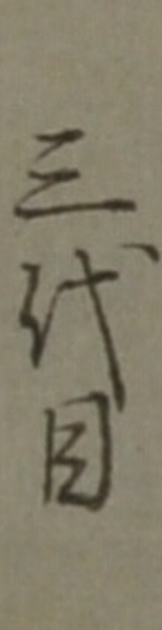三代目
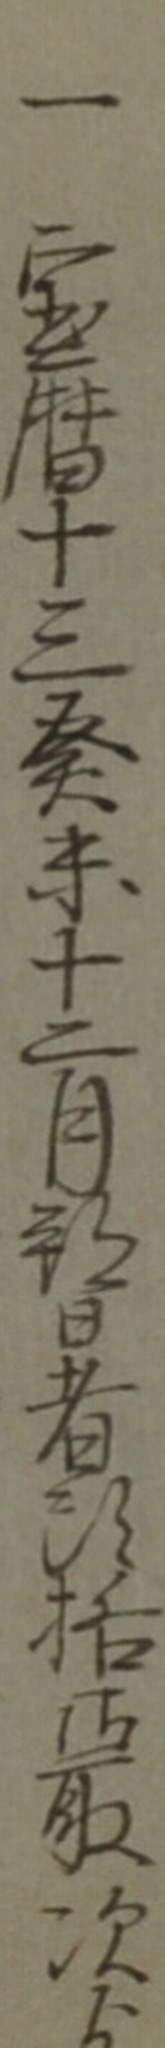一宝暦十三癸未十二月朔日者頭格御取次ゟ
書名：諸御役代々録（二）
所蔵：伊那市立高遠町図書館・合同会社AMANE
